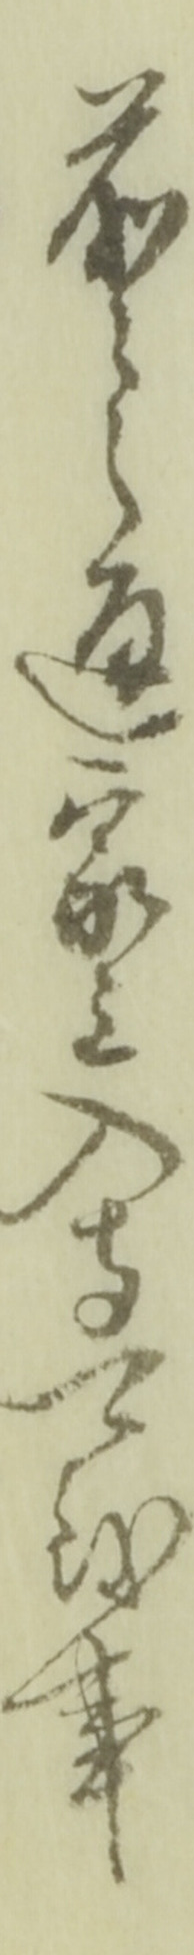前々之通家主入寺可致事
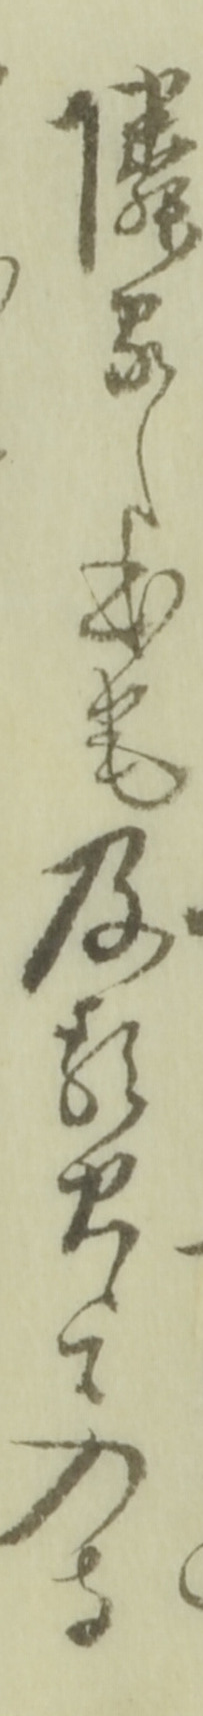隣家之本宅及類火候ハ入寺
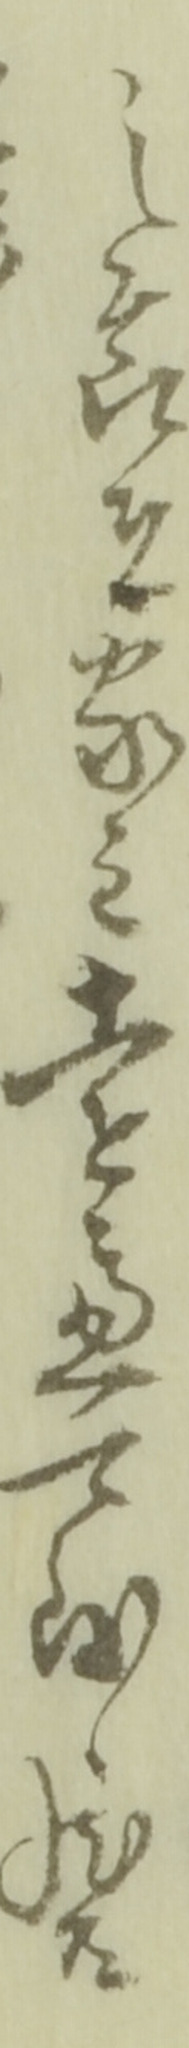之節者家主遠慮可致候然共
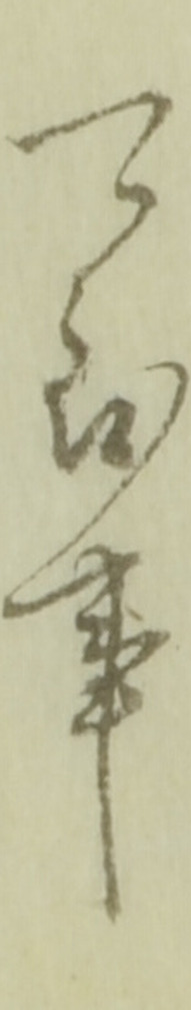可致事
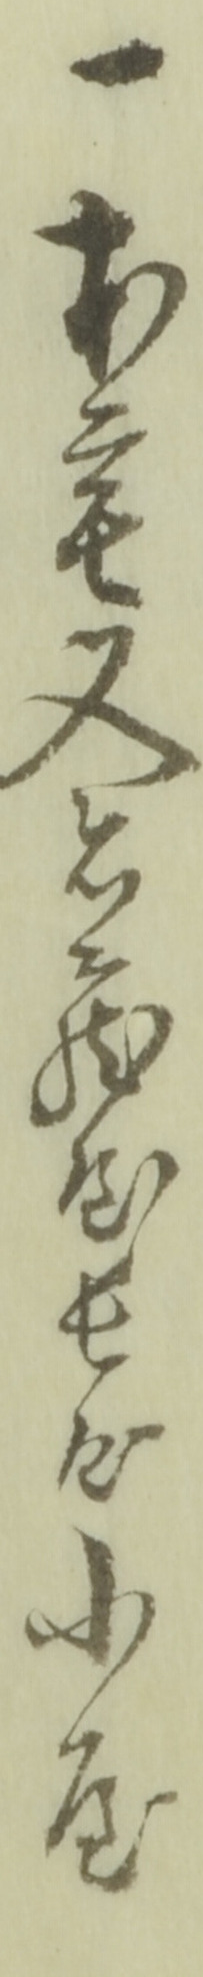一本宅又者蔵屋長屋小屋
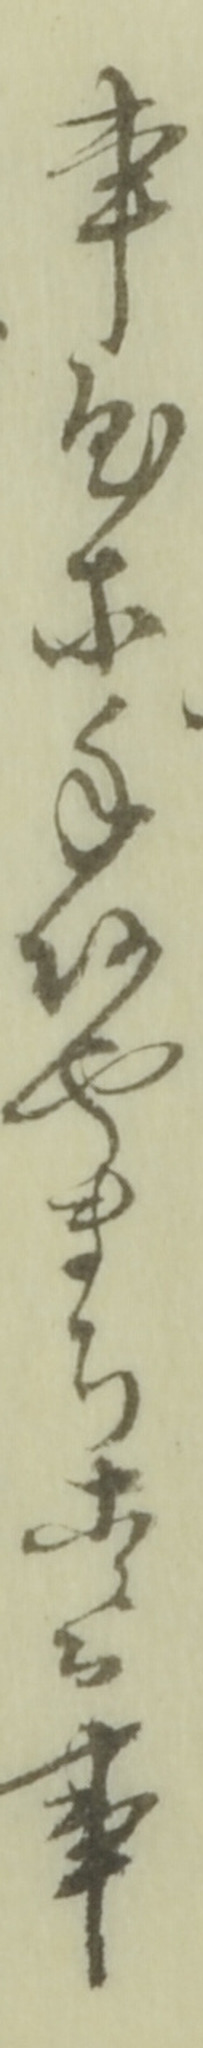車屋等手あやまち等二而事
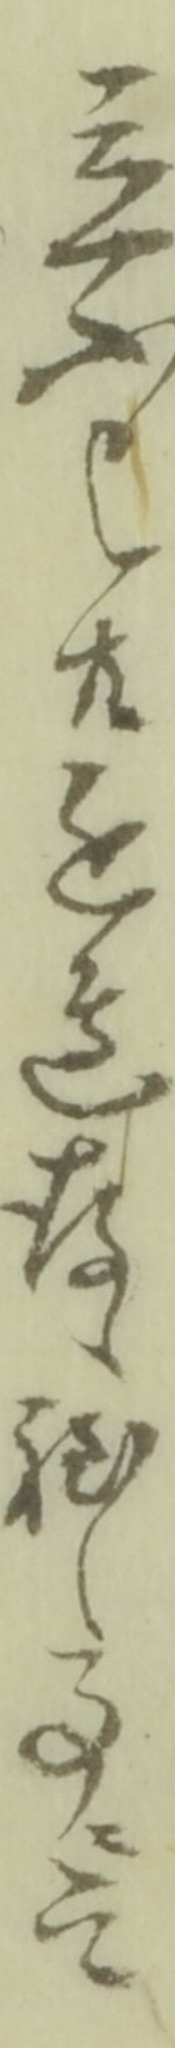立不申候共近辺存候躰之事二候て
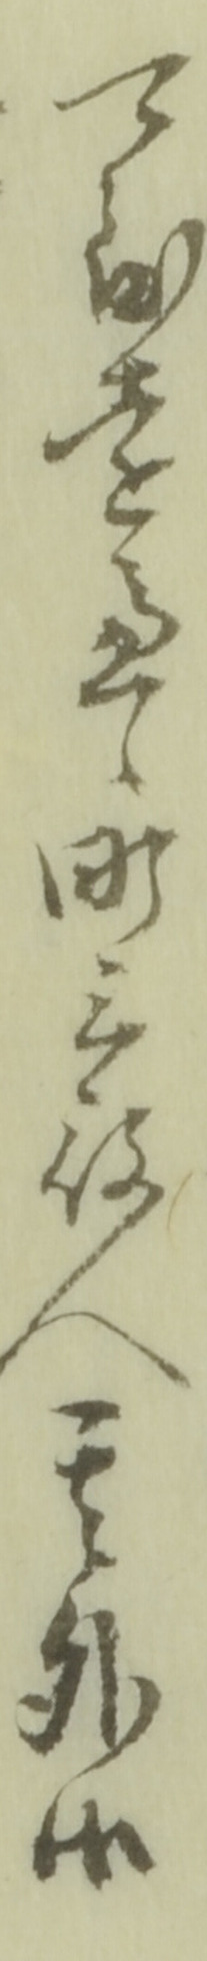可致遠慮候町三役人其外衆
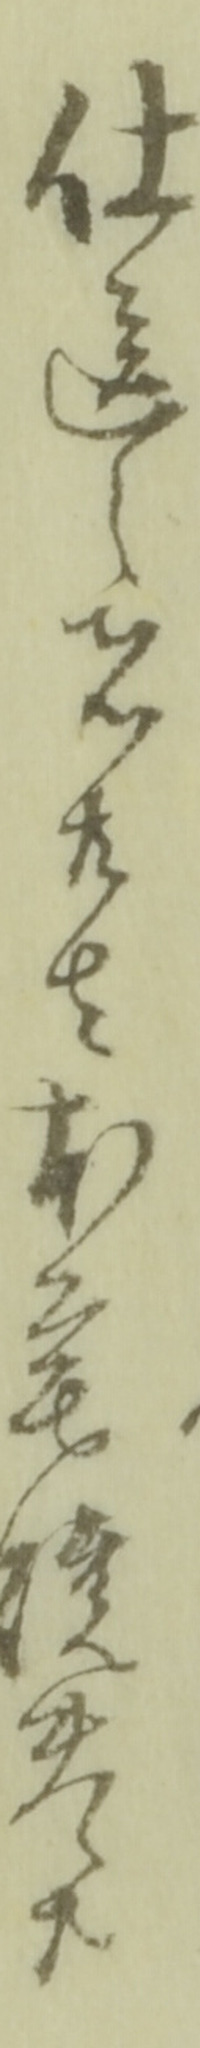仕送候者共者本宅焼失共
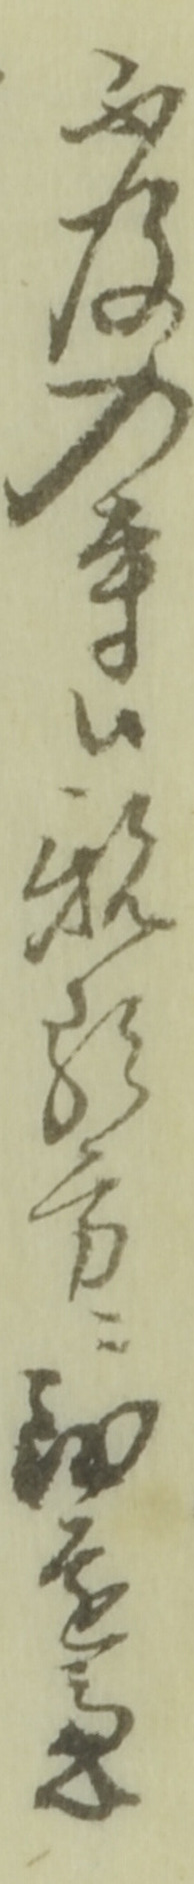不及入寺候親類方二致遠慮
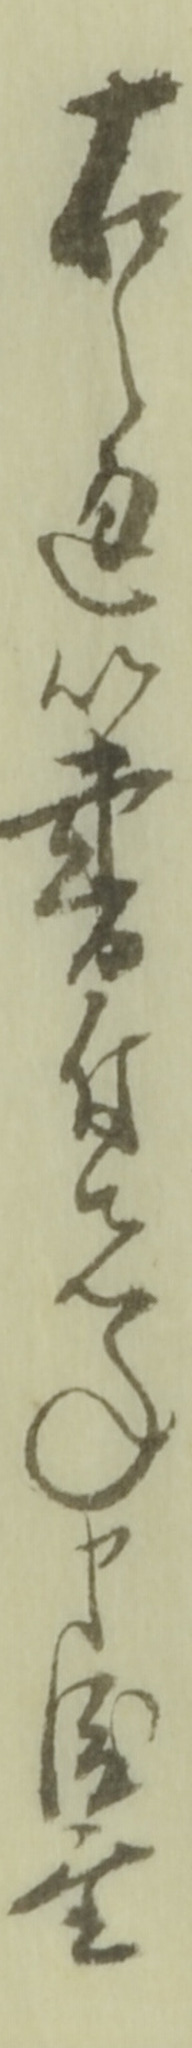右之通御書付先年申渡置
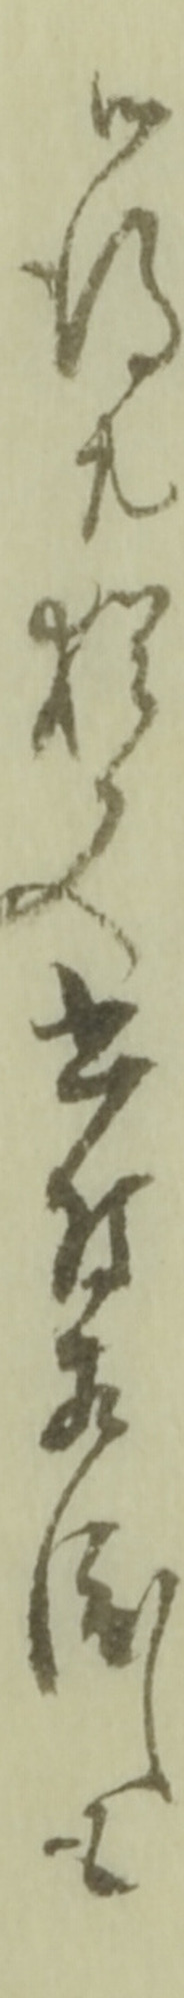候得共猶又書付相渡候以上
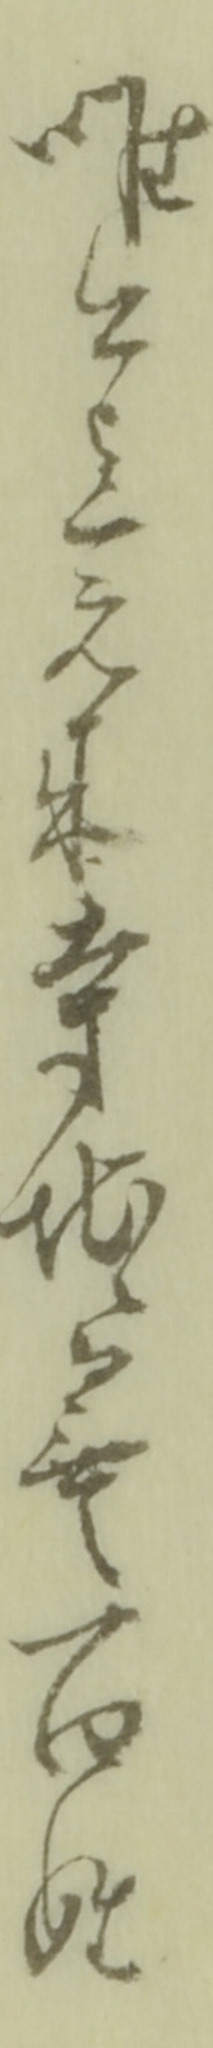唯今迄元来寺地二而無之百姓
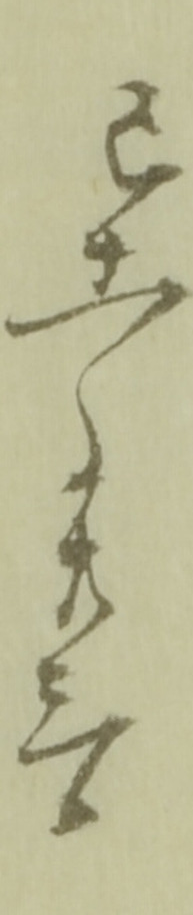己十一月廿三日
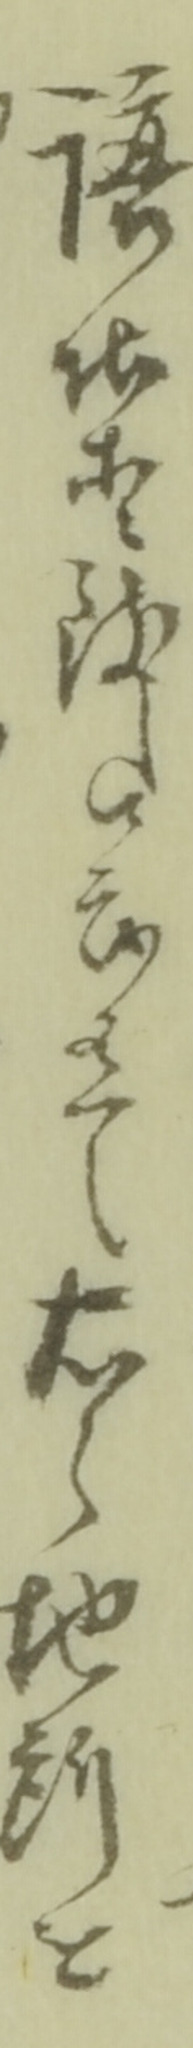慎地等二致候て茂有之候右之地所を
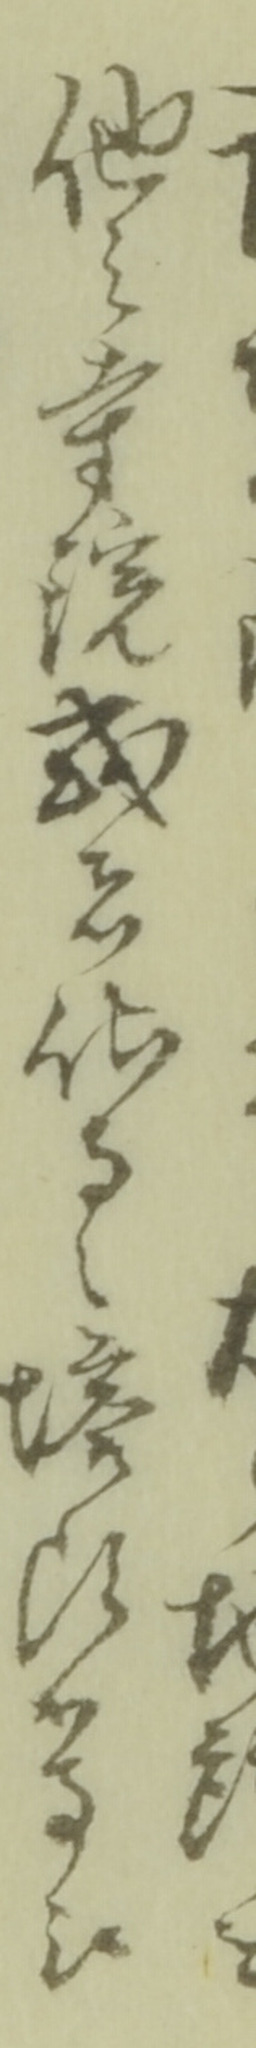他之寺院或者他寺之塔頭等え
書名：御公儀様御領主様御触書控
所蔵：伊那市立高遠町図書館・合同会社AMANE
